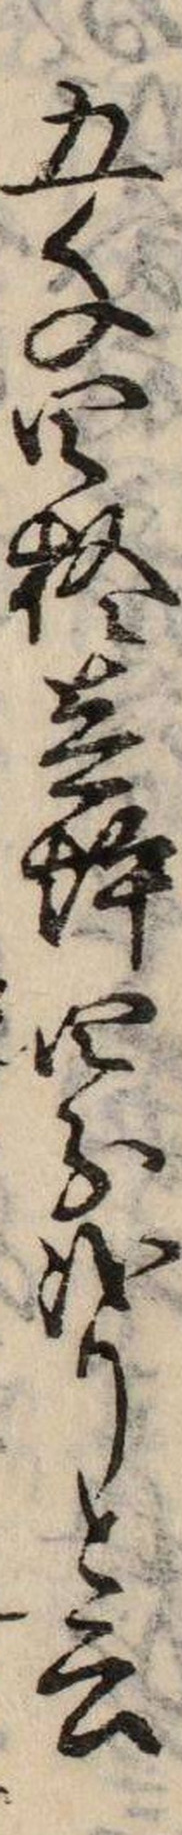五千四拾壱坪四分弐りと云
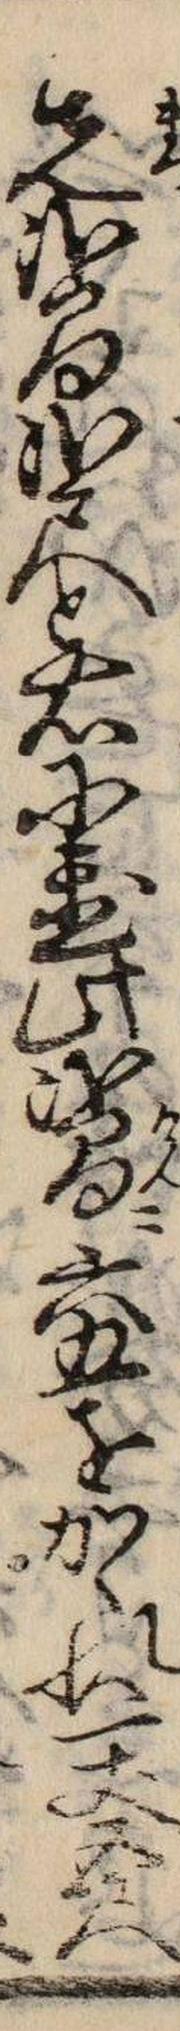先弐間弐尺と右に置此弐間に六五をかくれは一丈五尺
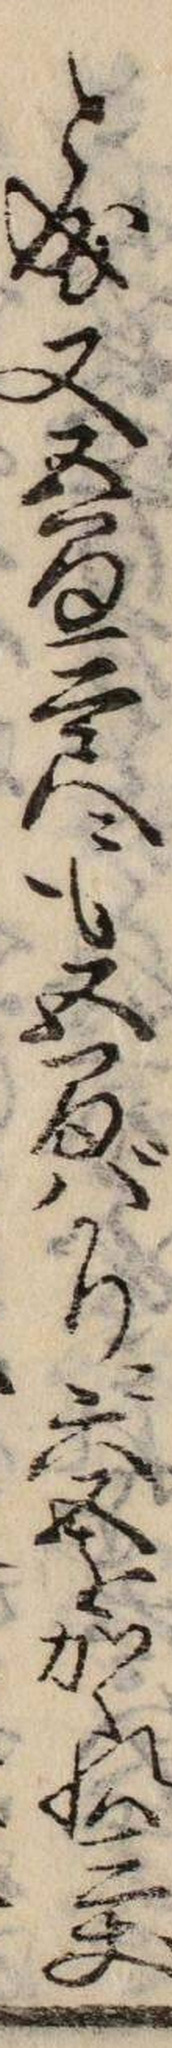と成又五間三尺にも五間ばかりに六五をかくれは三丈
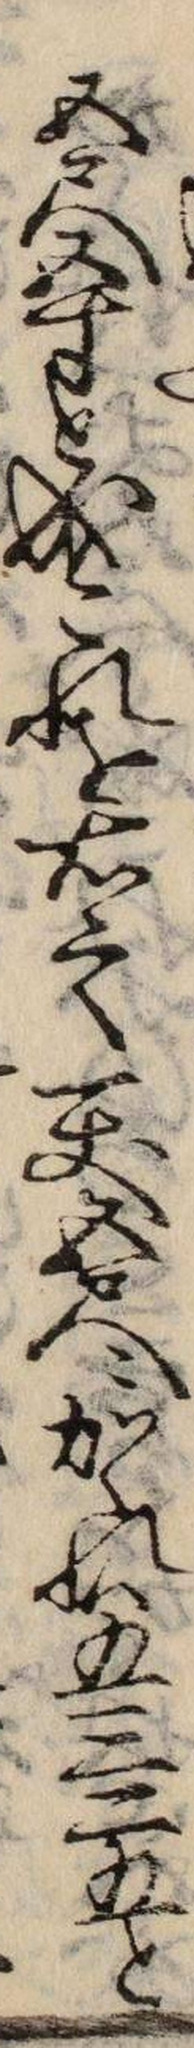五尺五寸と成とこれを右之一丈五尺にかくれは五三二五と
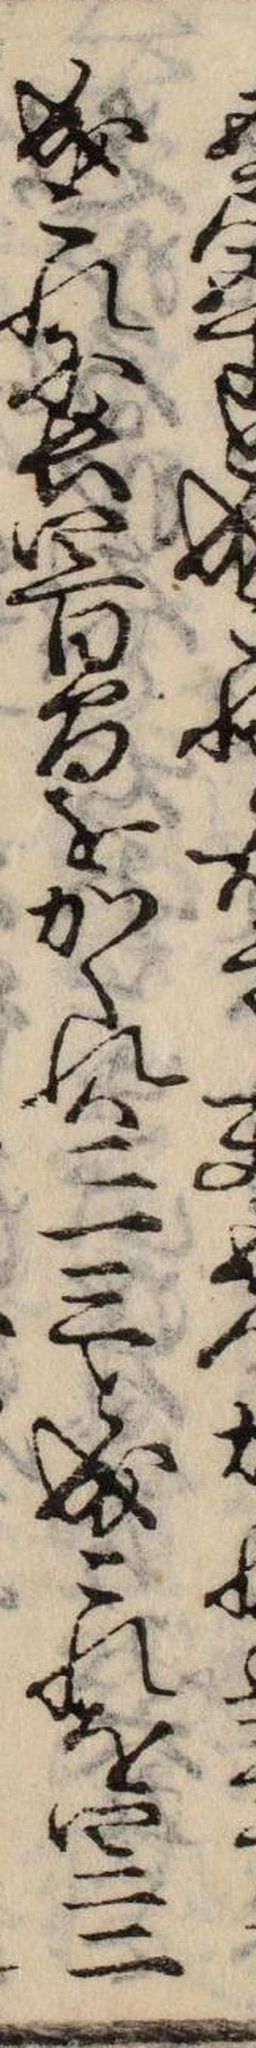成これに長四百間をかくれは二一三と成これを四二二
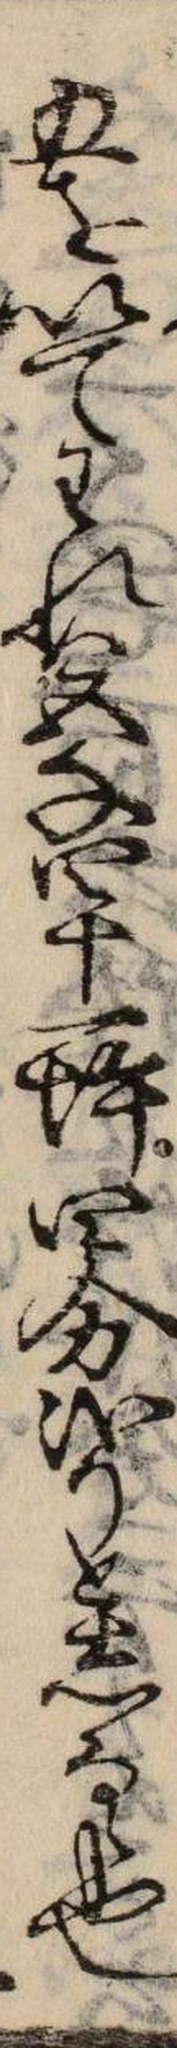五を以てわれは五千四十一坪四分弐りとしる也
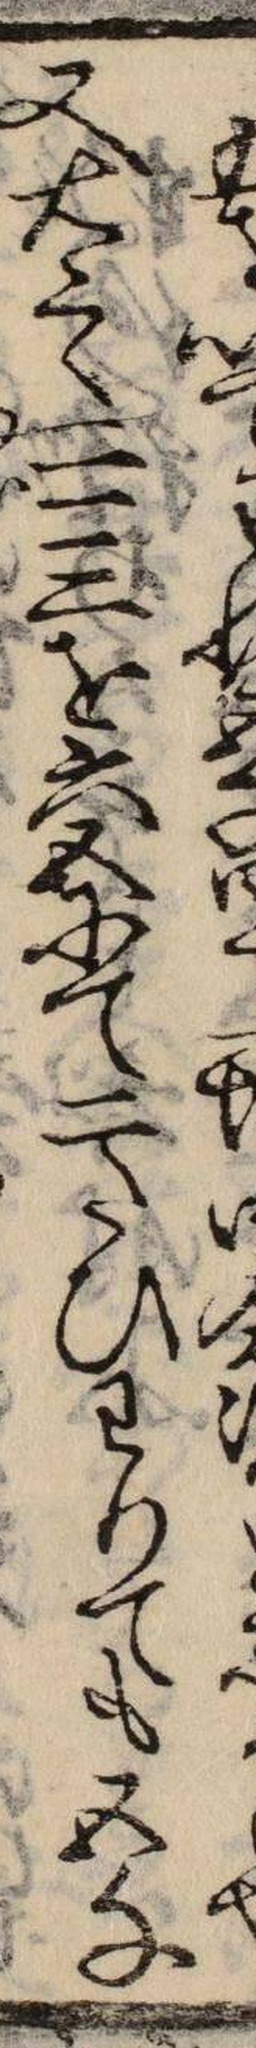又右之二一三を六五にて二たひわりても五千
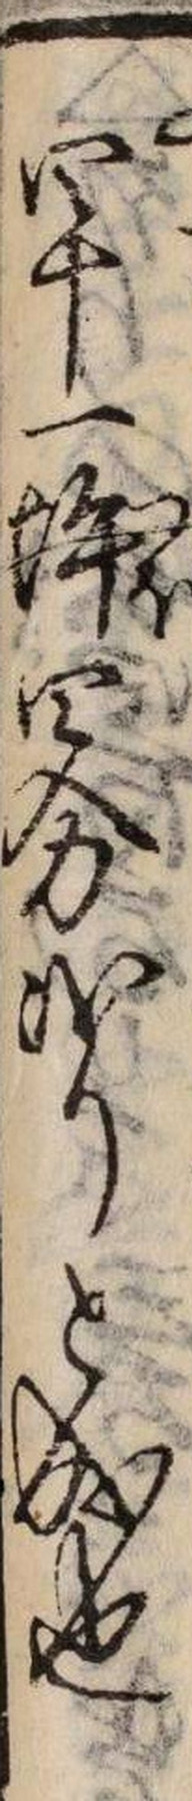四十一坪四分弐りと成也
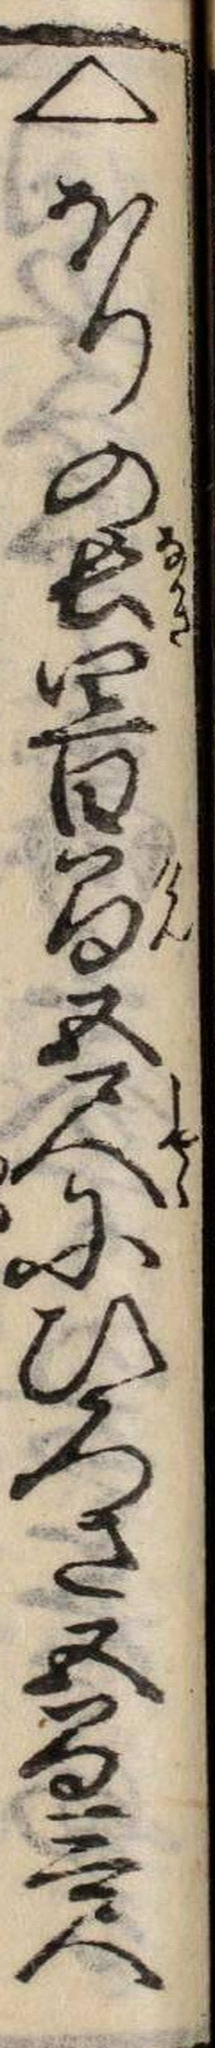△ほりの長四百間五尺にひろさ五間三尺
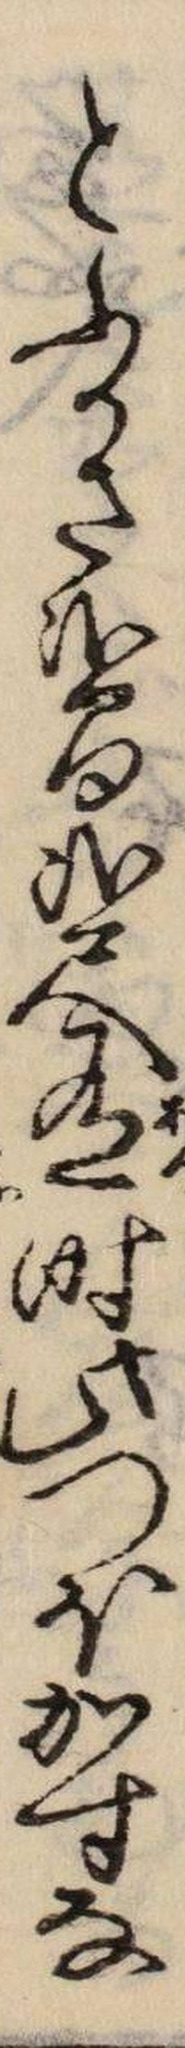とふかさ弐間弐尺有時此つほかすな
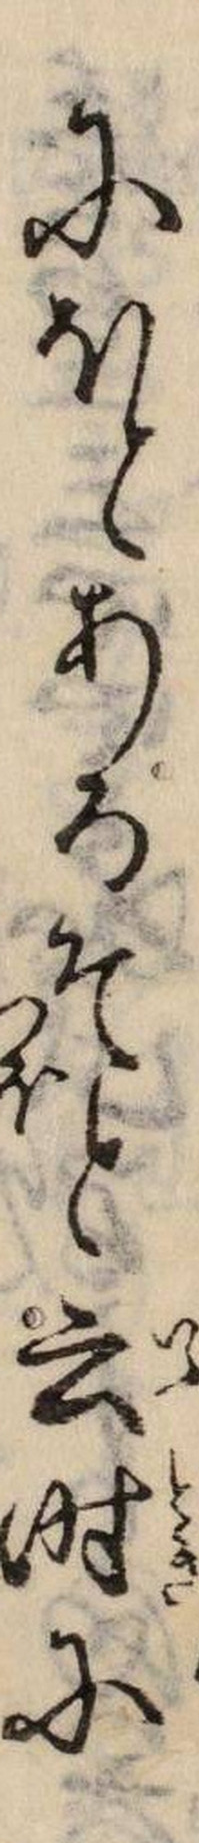にほとあるそと云時に
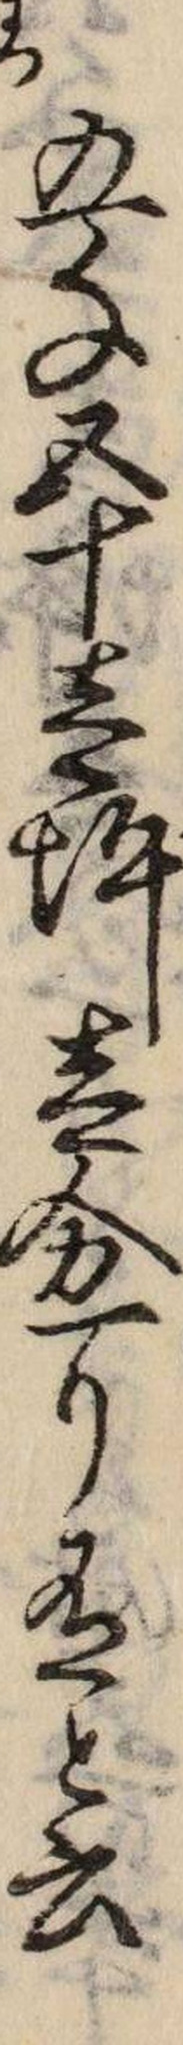五千五十壱坪壱分一り有と云
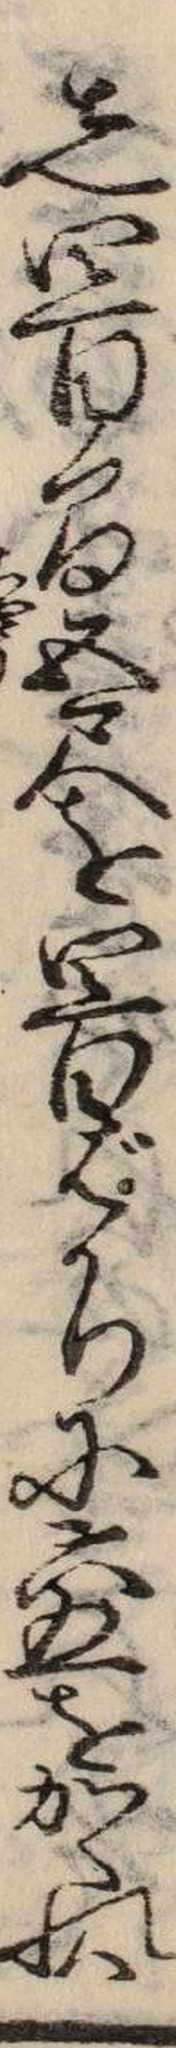先四百間五尺を四百ばかりに六五をかくれは
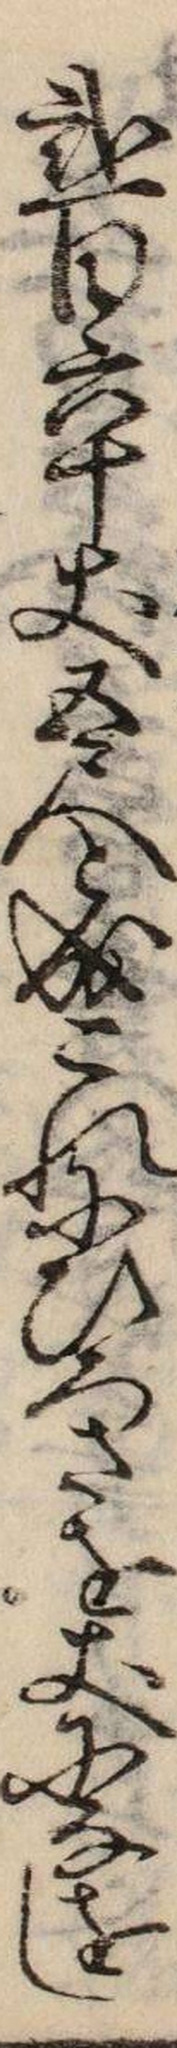弐百六十丈五尺と成これにひろさを丈になをし
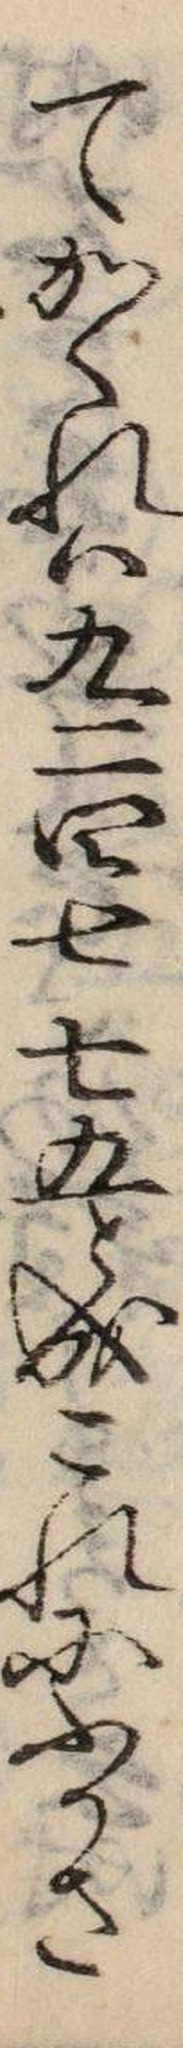てかくれは九二四七五と成これにふかさ
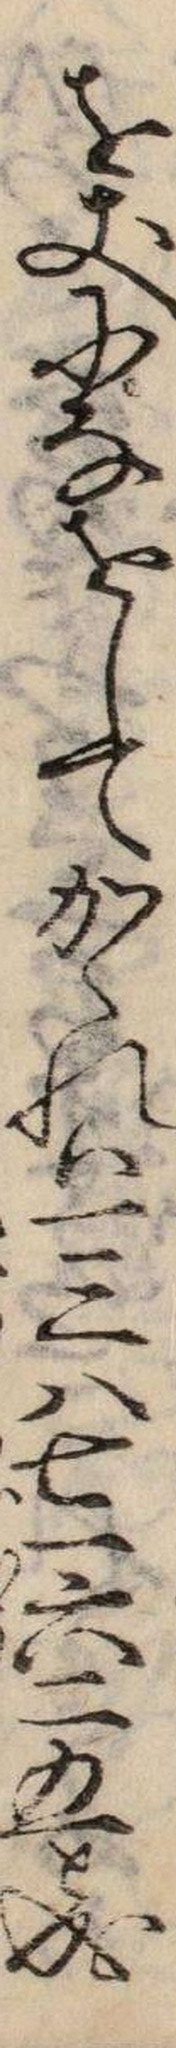を丈になをしてかくれは一三は七一六二五と成
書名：塵劫記（寛永11年自跋、京都府立京都学・歴彩館追貴8）
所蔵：京都府立京都学・歴彩館 国文学研究資料館
